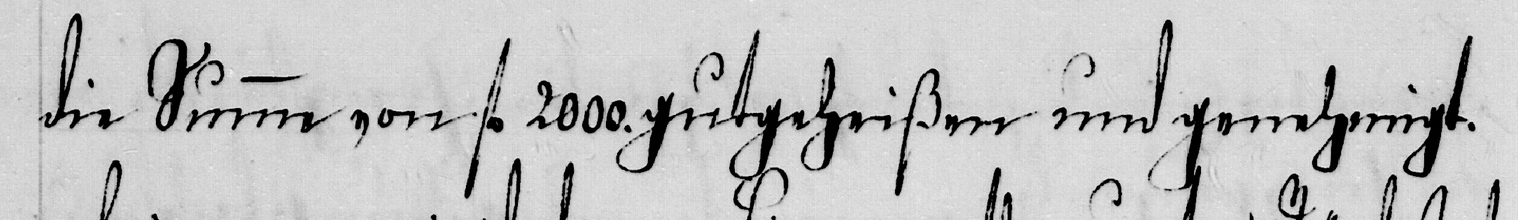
die Summe von fl. 2000. gutgeheißen und genehmigt.
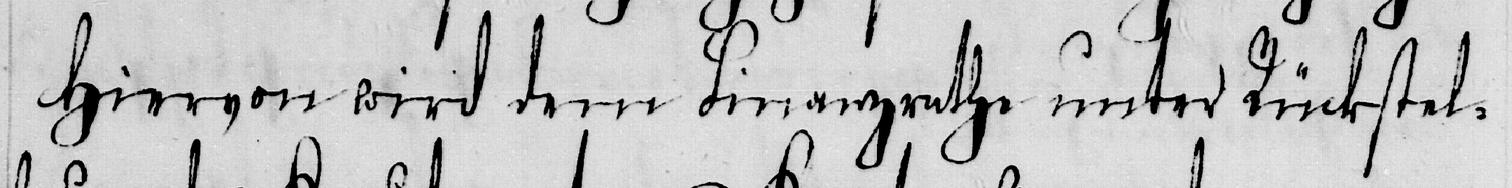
Hiervon wird dem Finanzrathe unter Rückstel¬
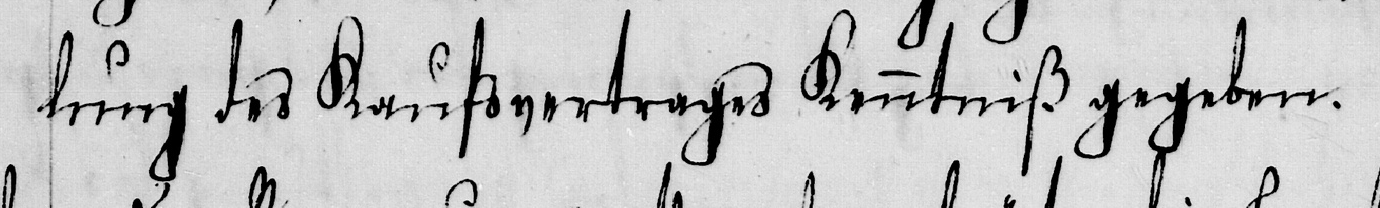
lung des Kaufsvertrages Kenntniß gegeben.
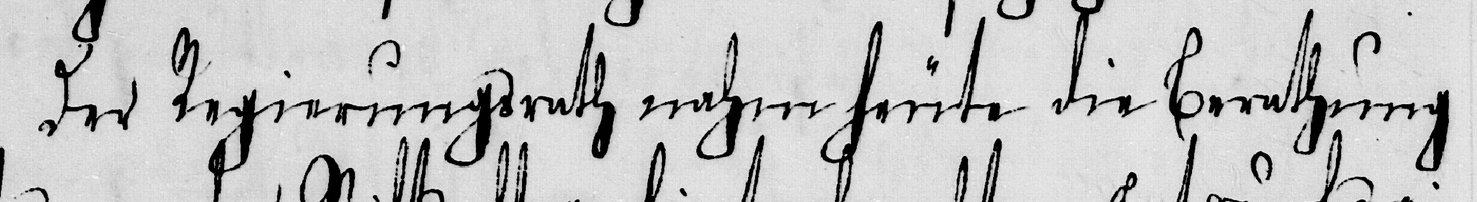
Der Regierungsrath nahm heute die Berathung
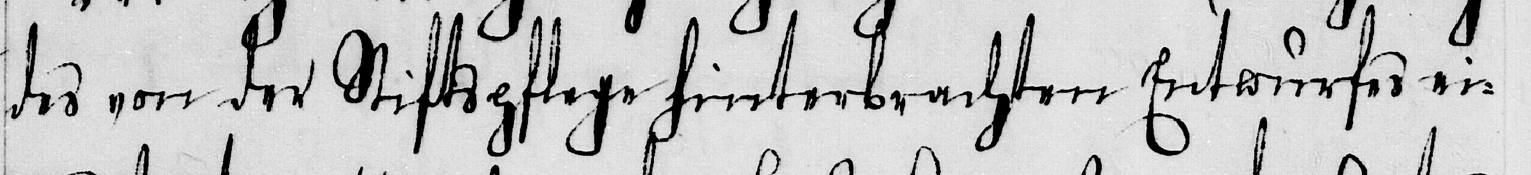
des von der Stiftspflege hinterbrachten Entwurfes ei¬
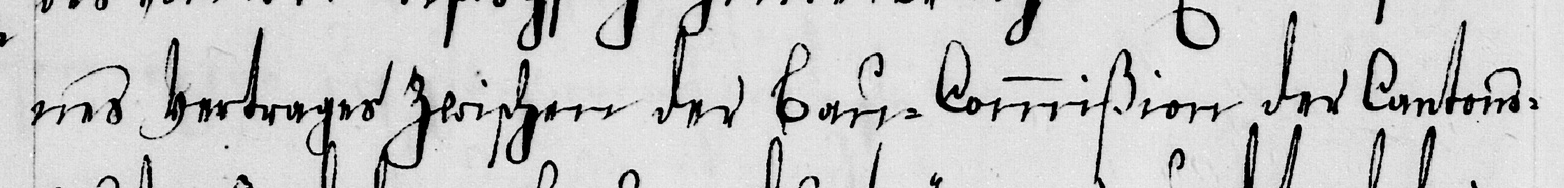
nes Vertrages zwischen der Bau-Commißion der Cantons¬
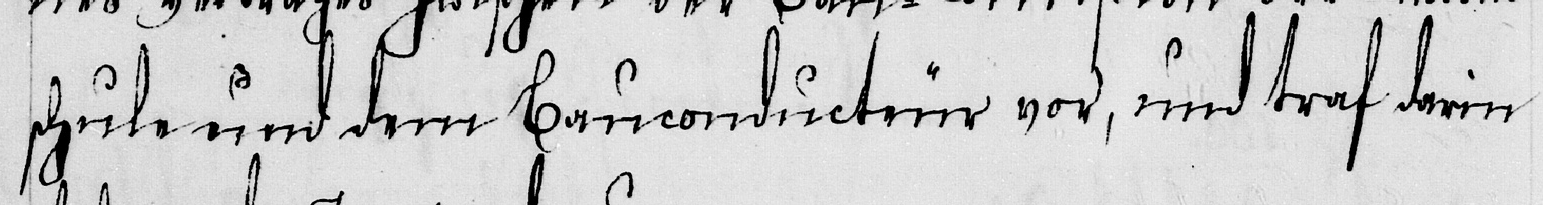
schule und dem Bauconducteur vor, und traf darin
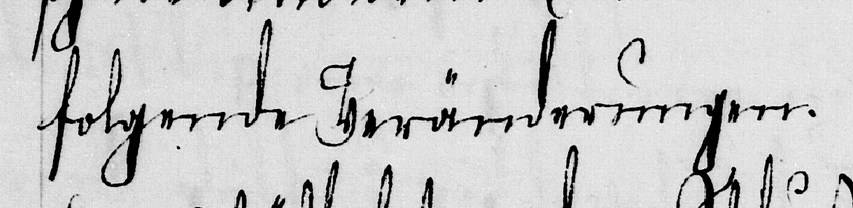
folgende Veränderungen.
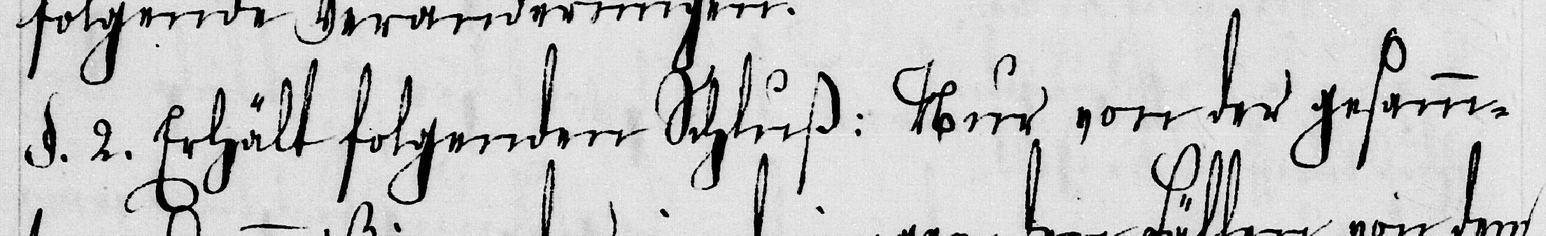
§. 2. Erhält folgenden Schluß: Nur von der gesamm¬
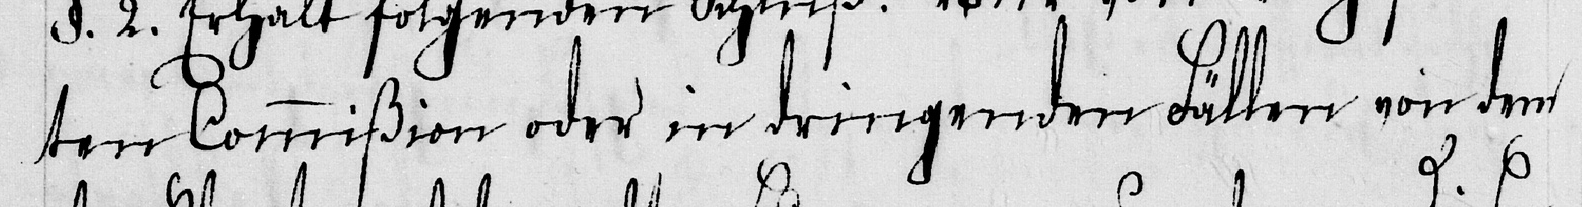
ten Commißion oder in dringenden Fällen von dem
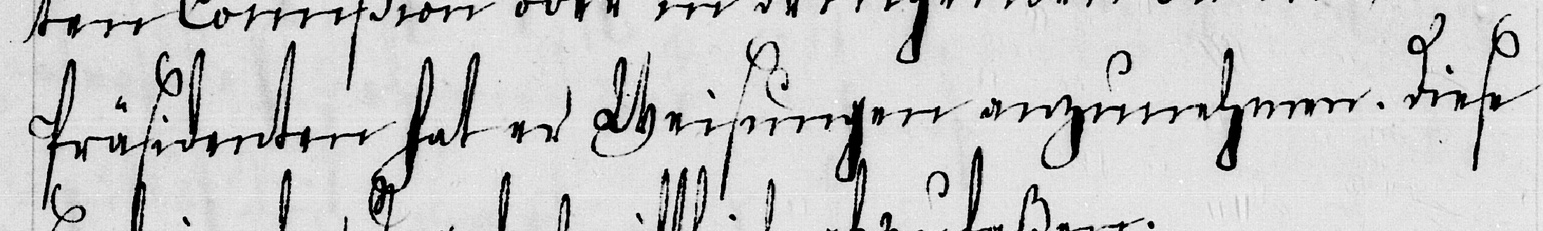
Präsidenten hat er Weisungen anzunehmen. Diese
